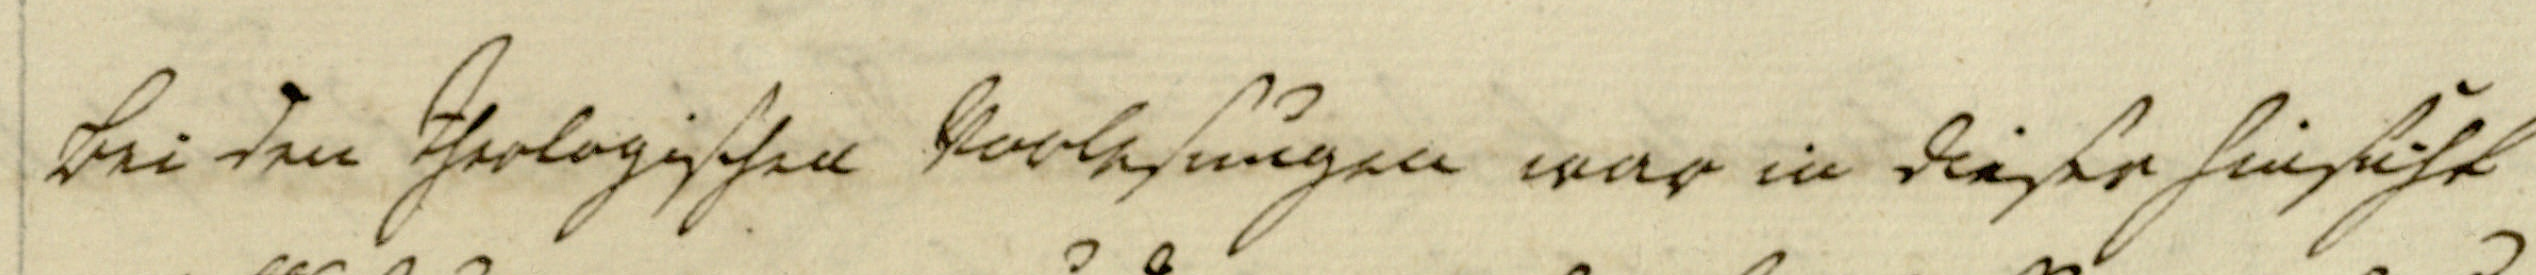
Bei den Theologischen Vorlesungen war in dieser Hinsicht
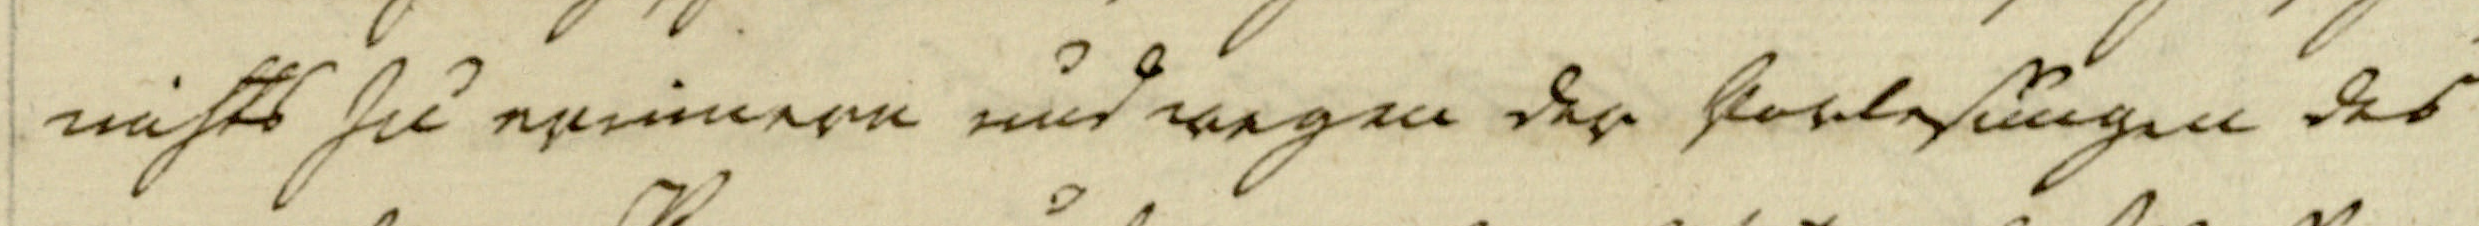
nichts zu erinnern und wegen der Vorlesungen des
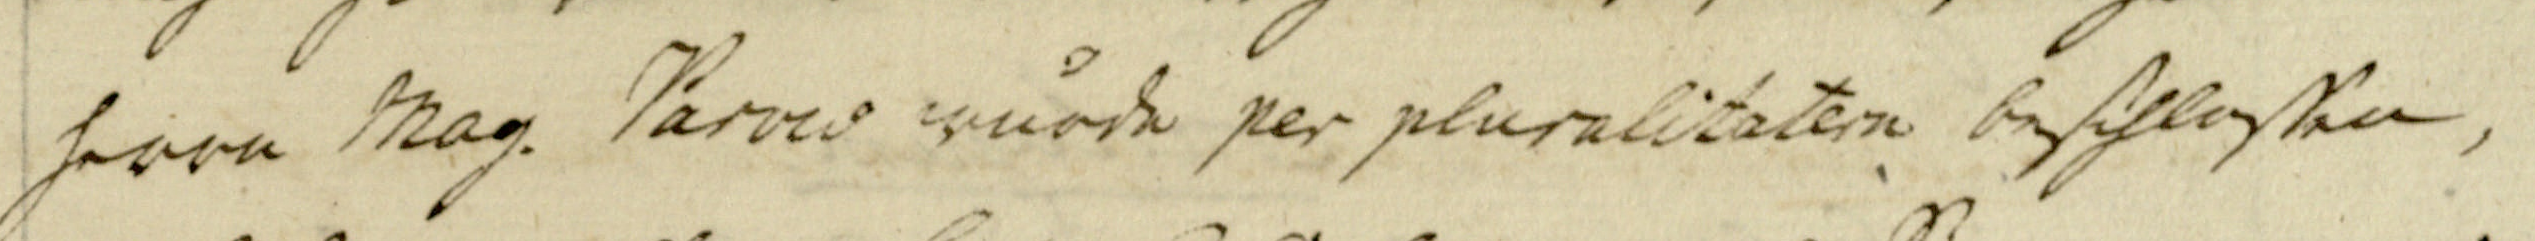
Herrn Mag. Parow wurde per pluralitatem beschlossen,
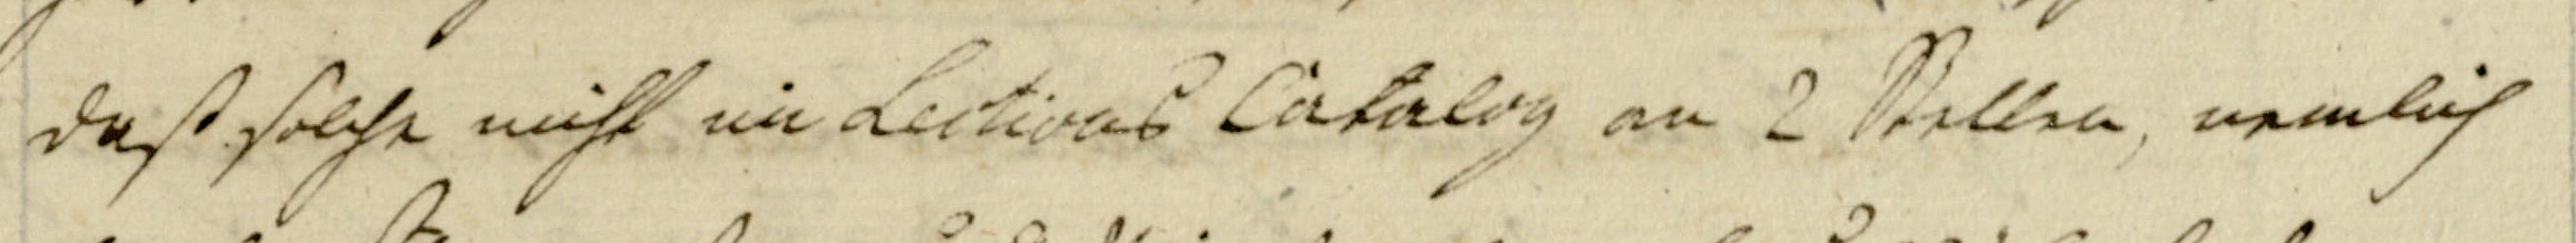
daß solche nicht in Lections Catalog an 2 Stellen, nemlich
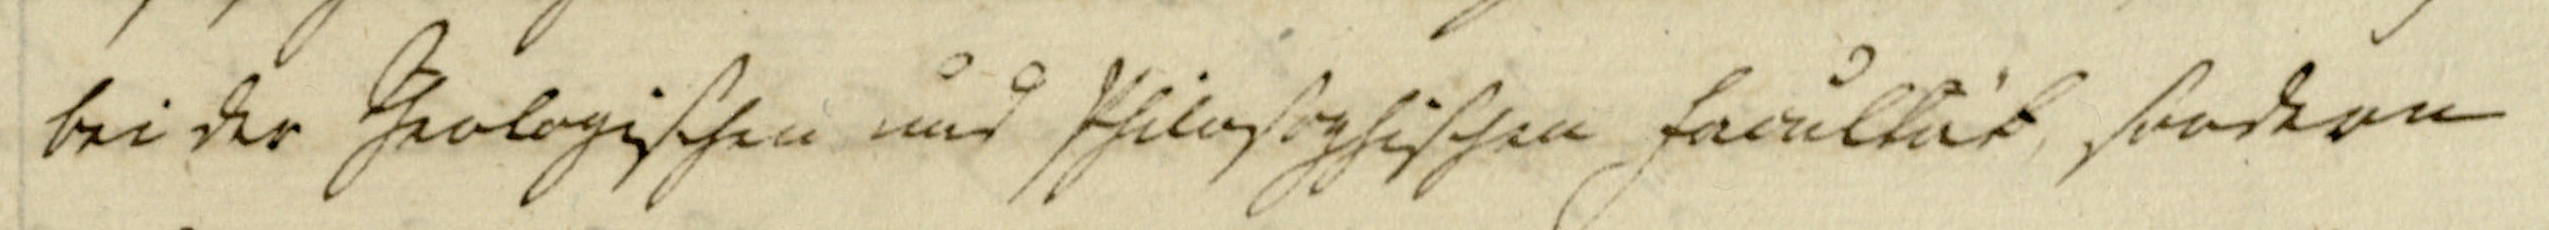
bei der Theologischen und Philosophischen Facultät, sondern
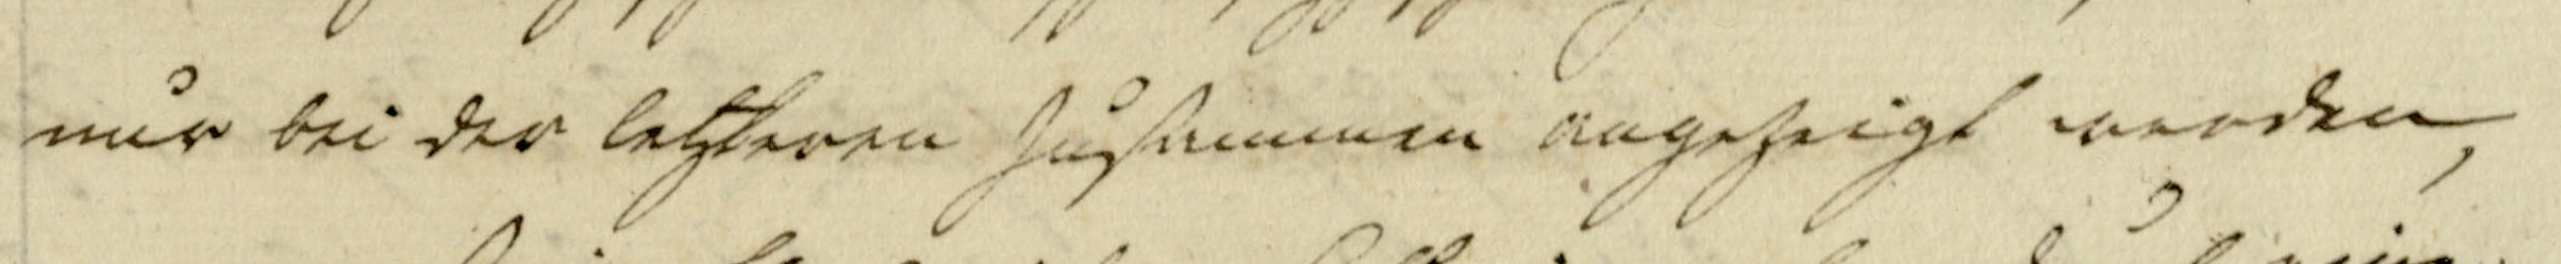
nur bei der letzteren zusammen angezeiget werden,
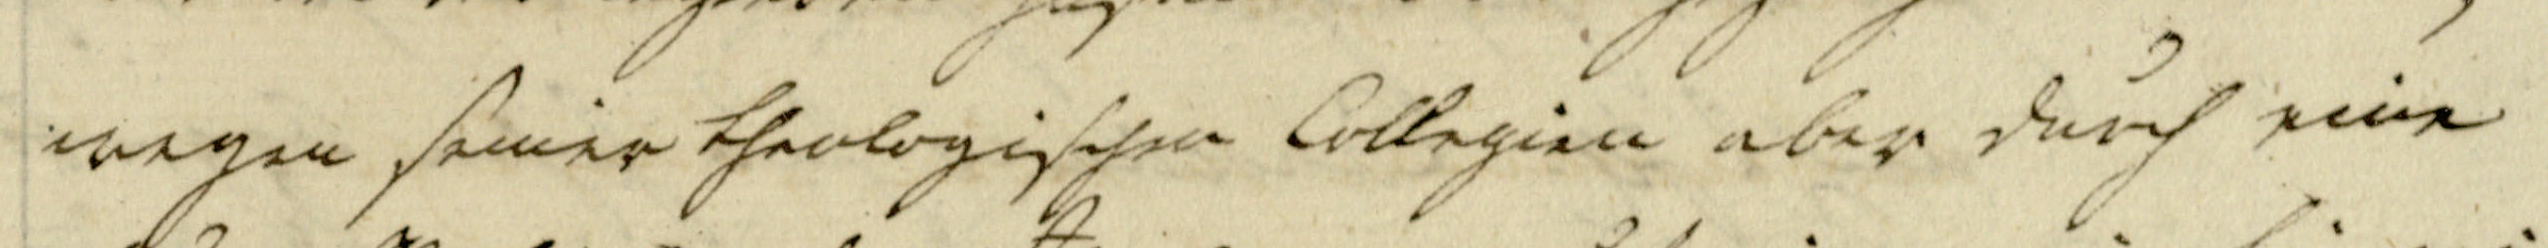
wegen seiner theologischen Collegien aber durch eine
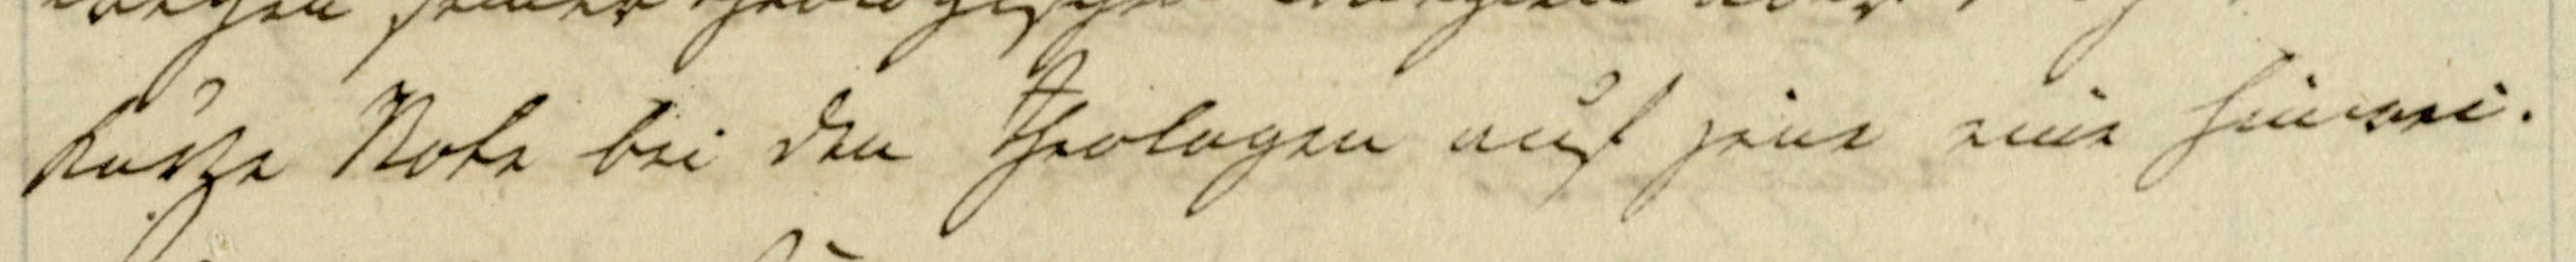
kurze Note bei den Theologen auf jene eine Hinwei¬
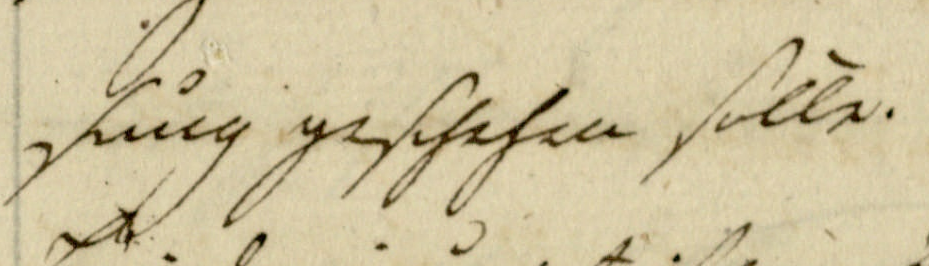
sung geschehen solle.
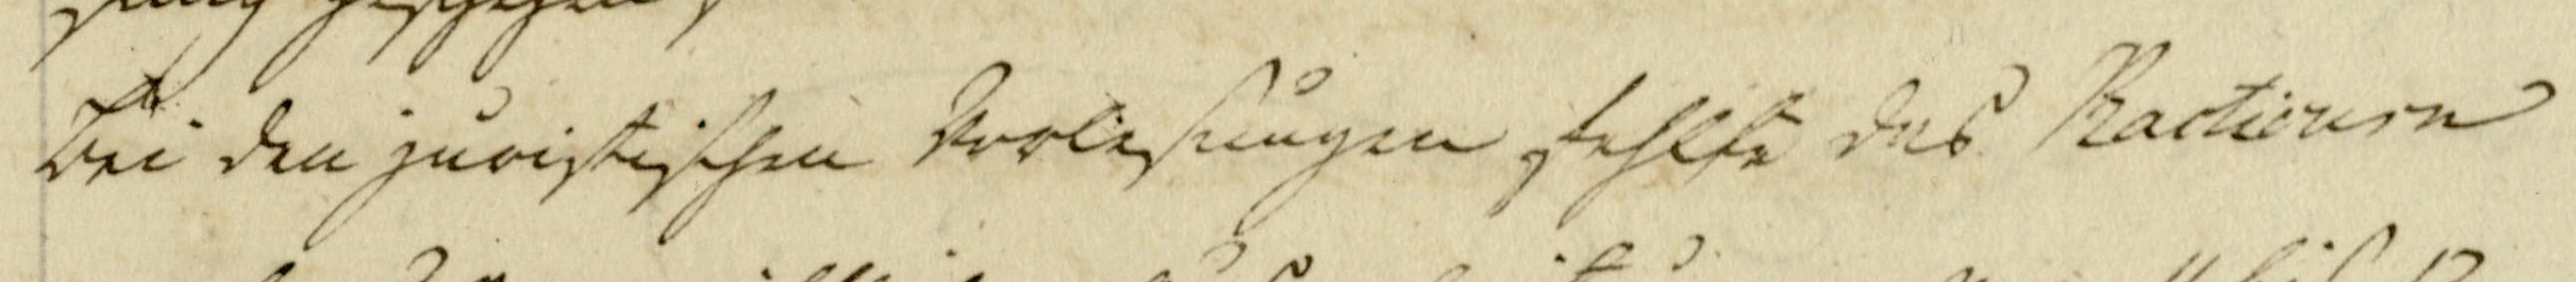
Bei den juristischen Vorlesungen fehlte des Practicum
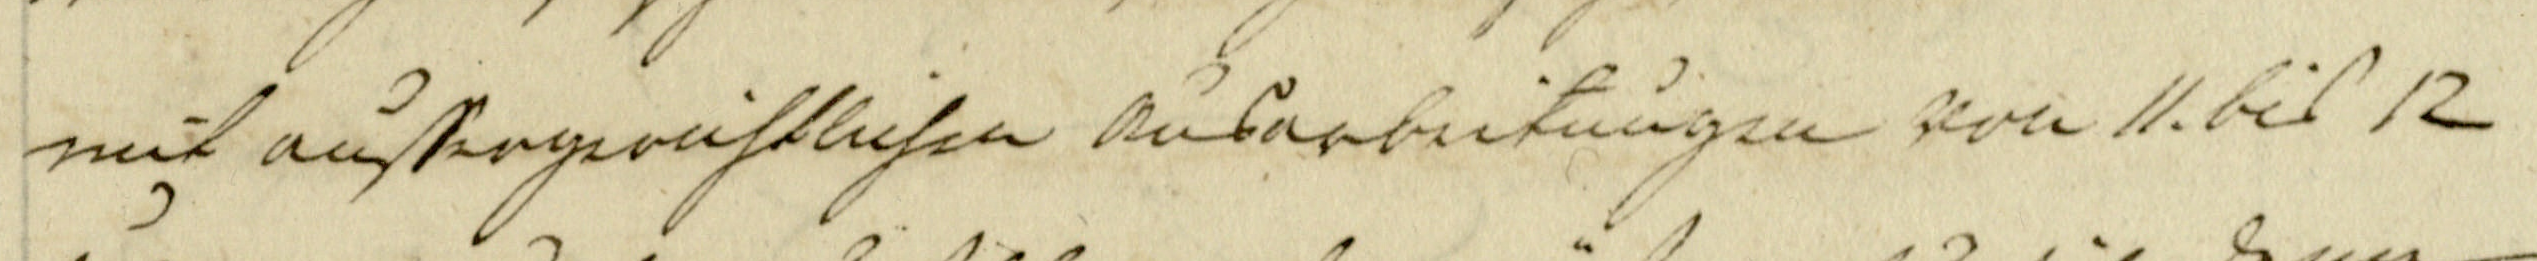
mit aussergerichtlichen Ausarbeitungen von 11 bis 12
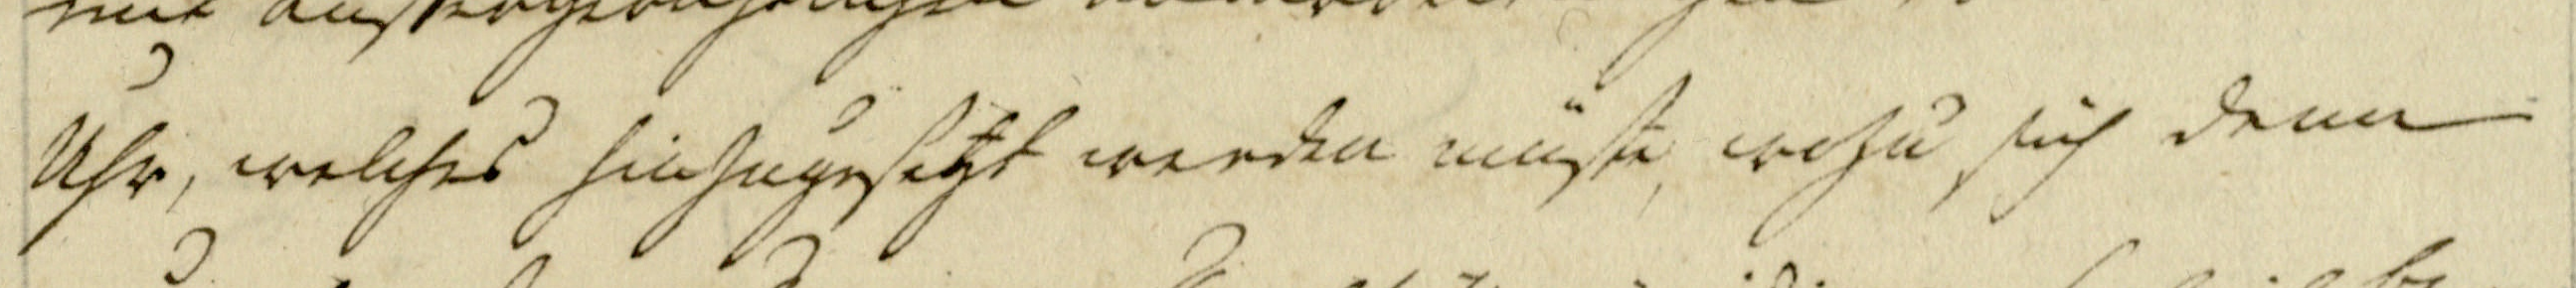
Uhr, welches hinzugesetzt werden müßte, wozu sich denn
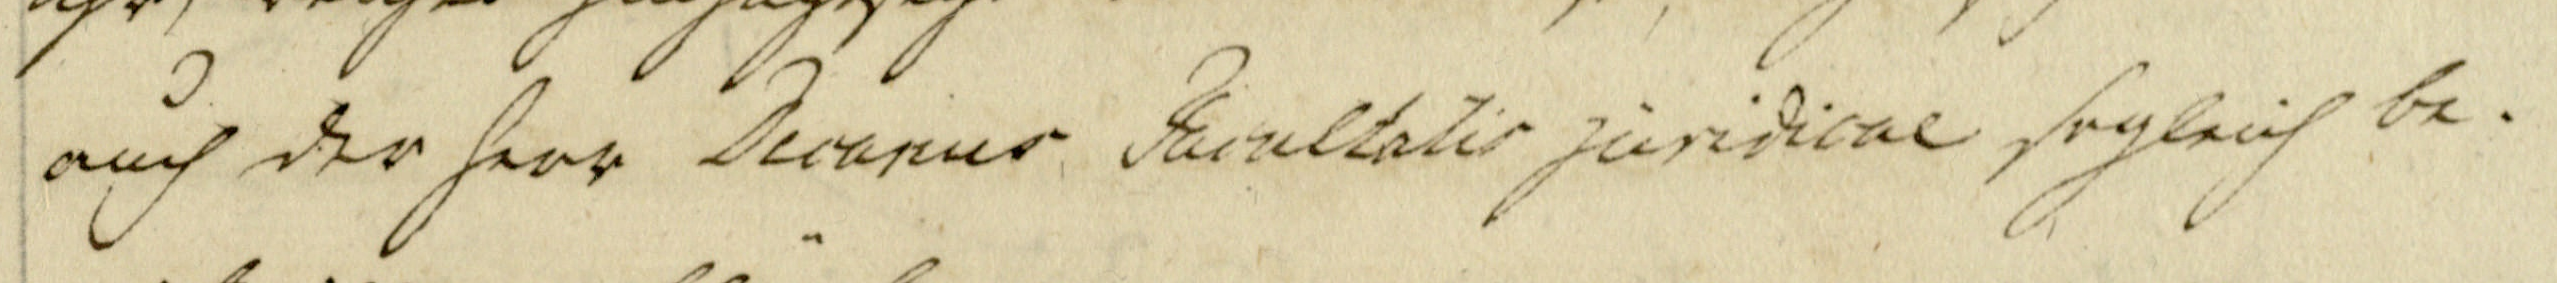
auch der Herr Decanus Facultatis juridicae sogleich be¬
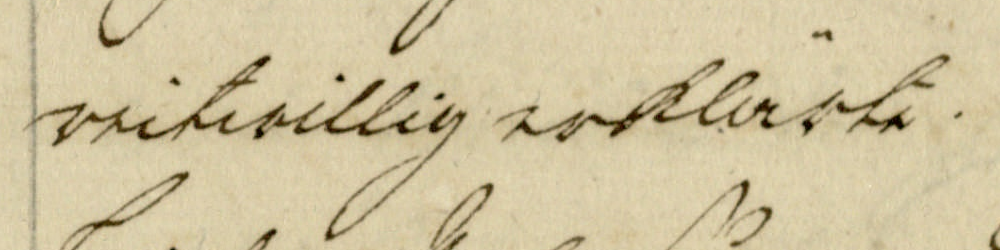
reitwillig erklärte.
